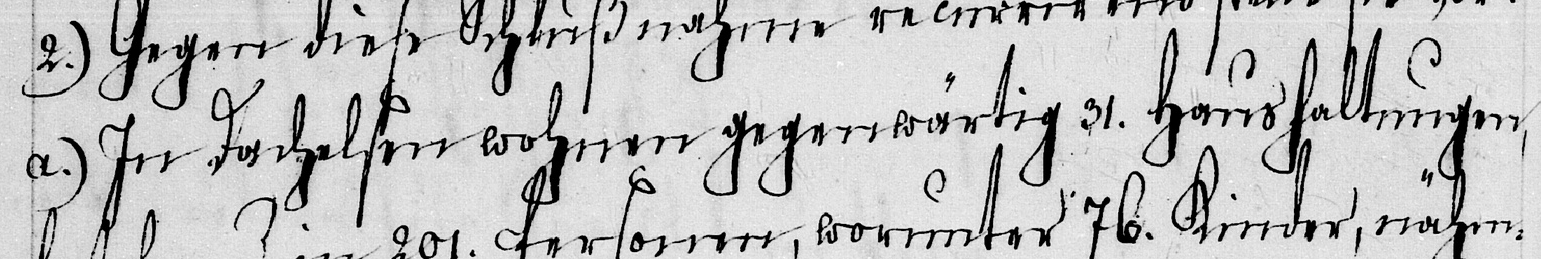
a.) In Dachelsen wohnen gegenwärtig 31. Haushaltungen,
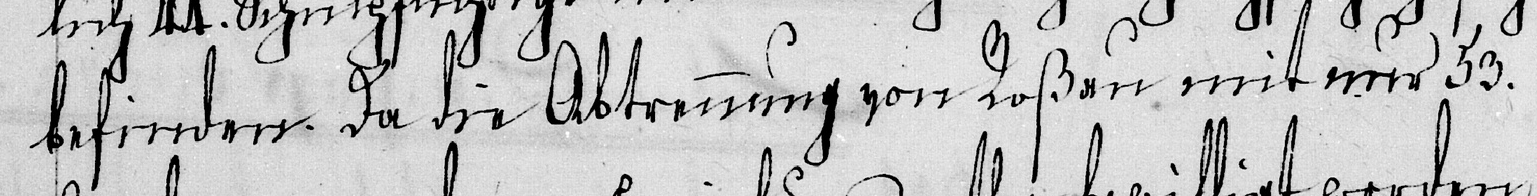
befinden. Da die Abtrennung von Roßau mit nur 53.
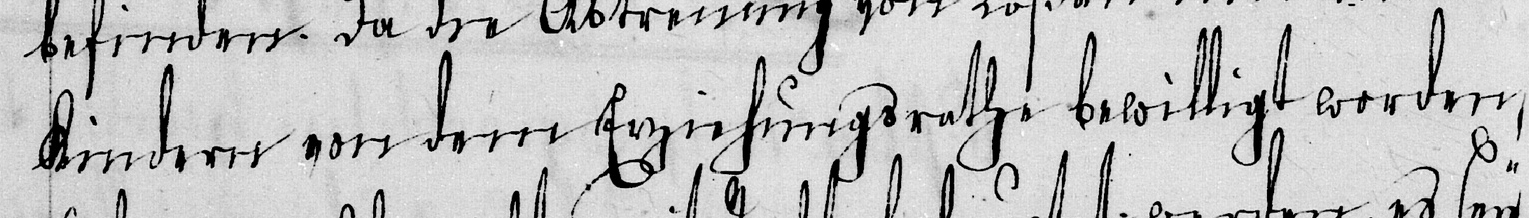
Kindern von dem Erziehungsrathe bewilligt worden,
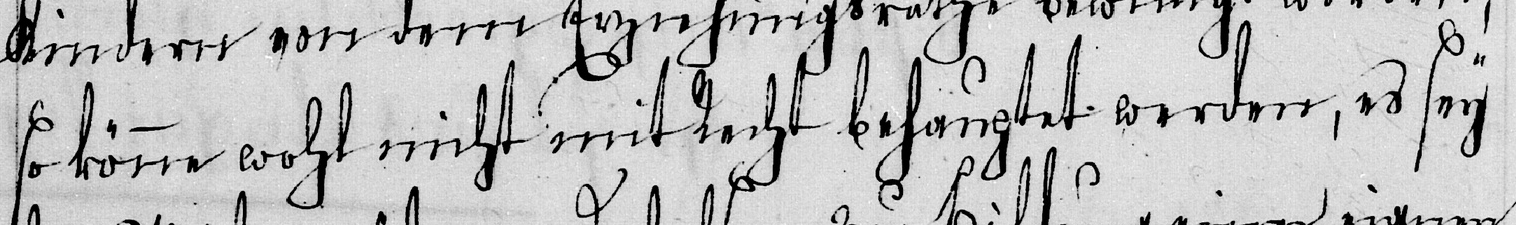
so könne wohl nicht mit Recht behauptet werden, es sey
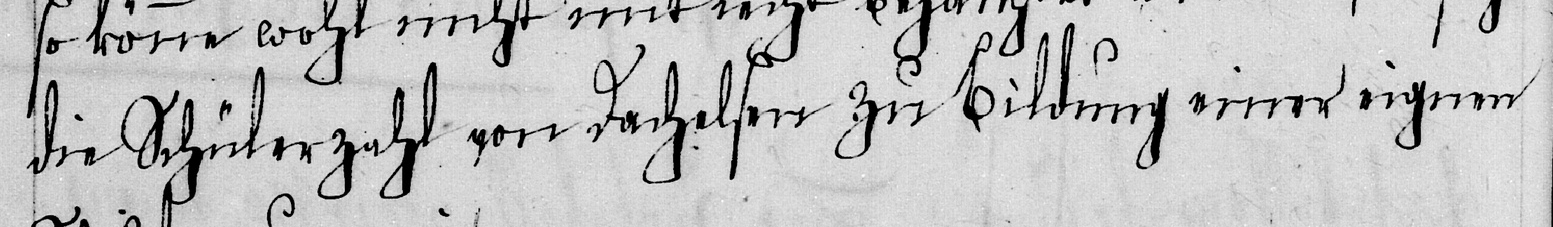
die Schülerzahl von Dachelsen zu Bildung einer eigenen
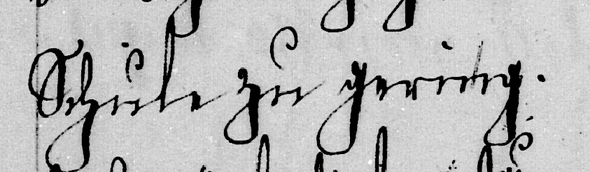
Schule zu gering.
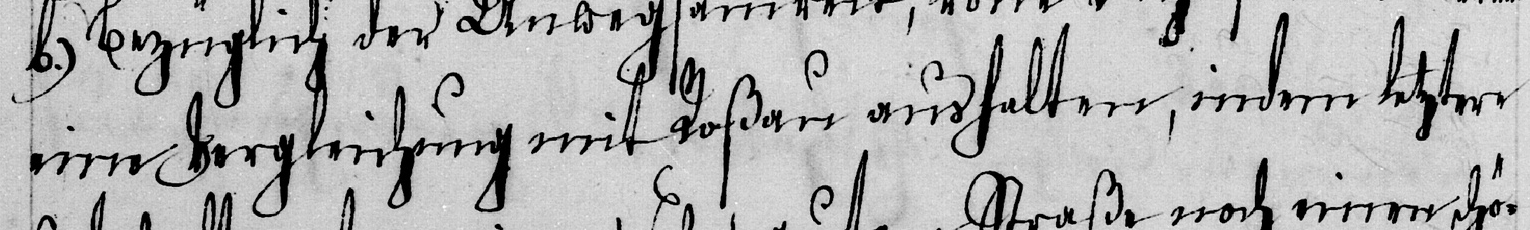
eine Vergleichung mit Roßau aushalten, indem letztere
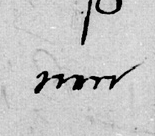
fend
